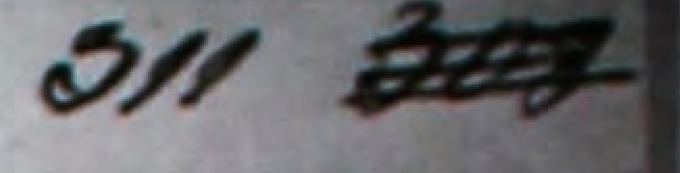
311 308
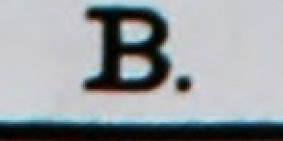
B.
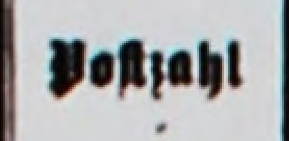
Postzahl
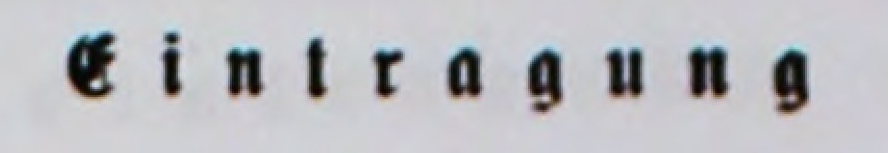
Eintragung
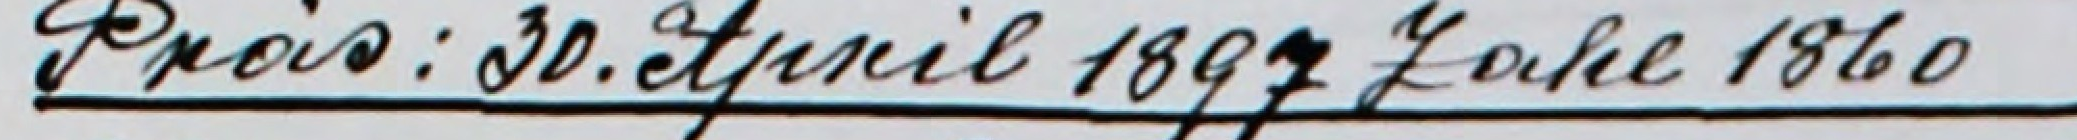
Präs: 30. April 1897 Zahl 1860
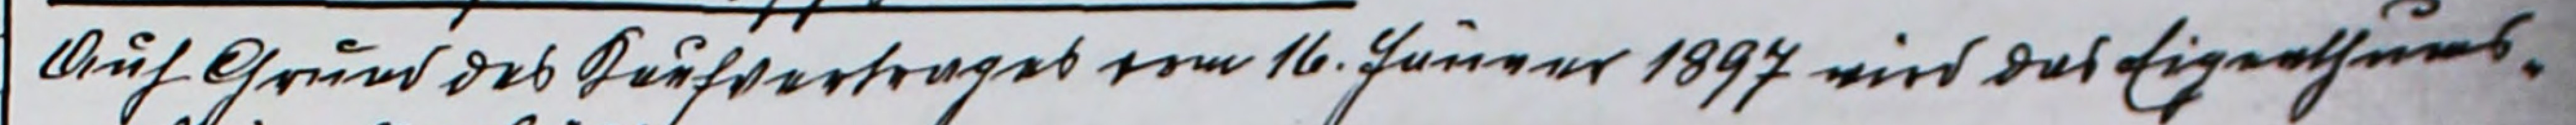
Auf Grund des Kaufvertrages vom 16. Jänner 1897 wird das Eigerthums„
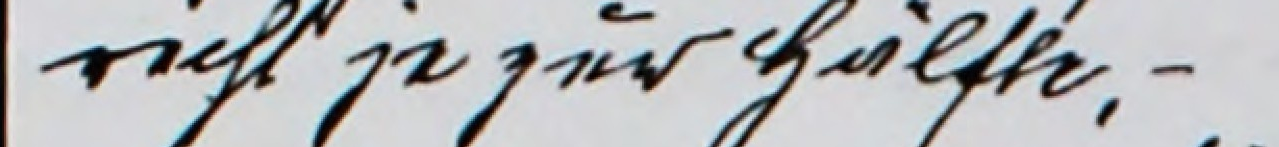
recht je zur Hälfte, -
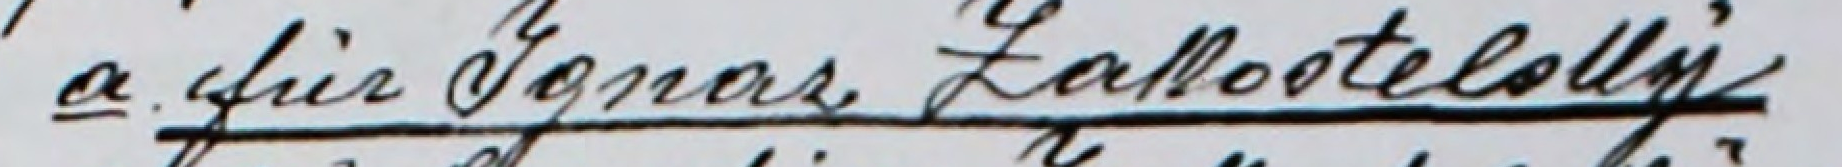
a. für Ignaz Zakostelskÿ
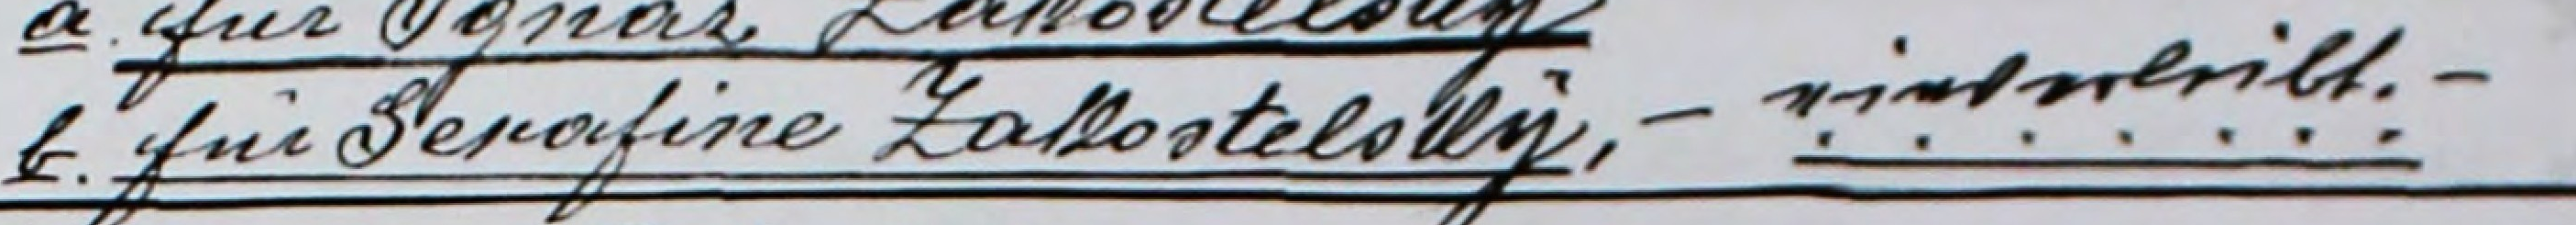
b. für Gerafine Zakostelskÿ, - einverleibt. -
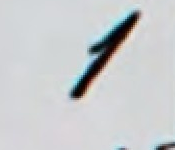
1
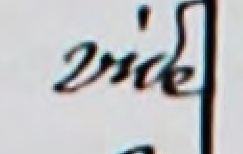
vide
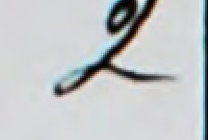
2
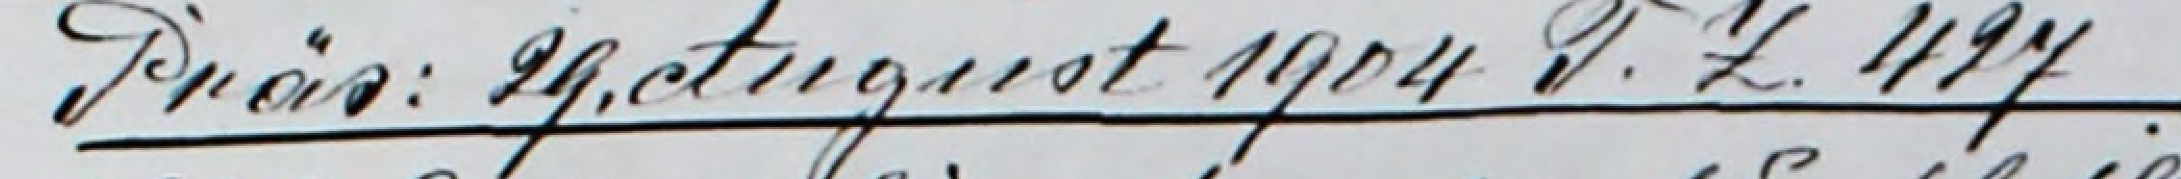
Präs: 29. August 1904 T.Z. 427.
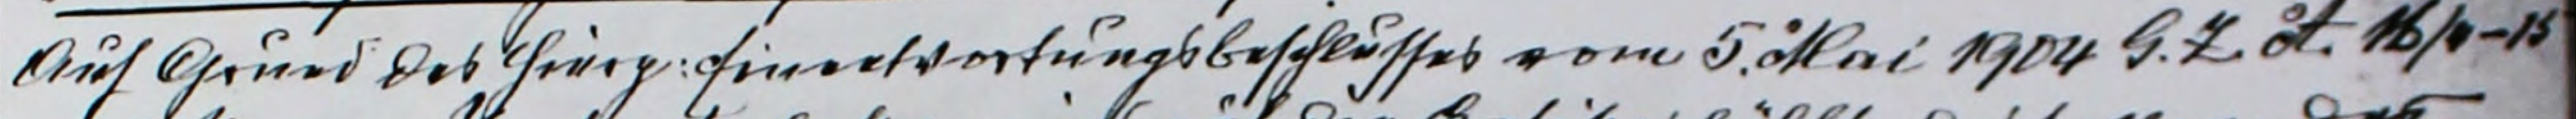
Auf Grund des hierg: Einentvortungsbeschlusses vom 5. Mai 1904 G.Z.A. 16/4-15
